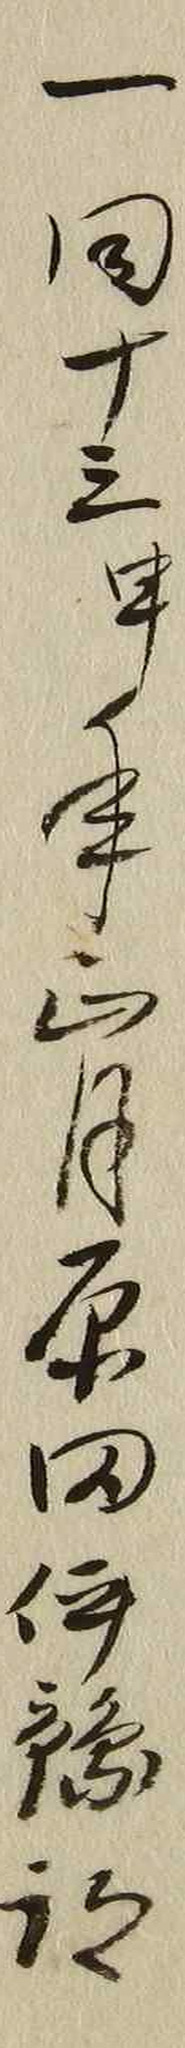一同十三申年正月原田伊予跡
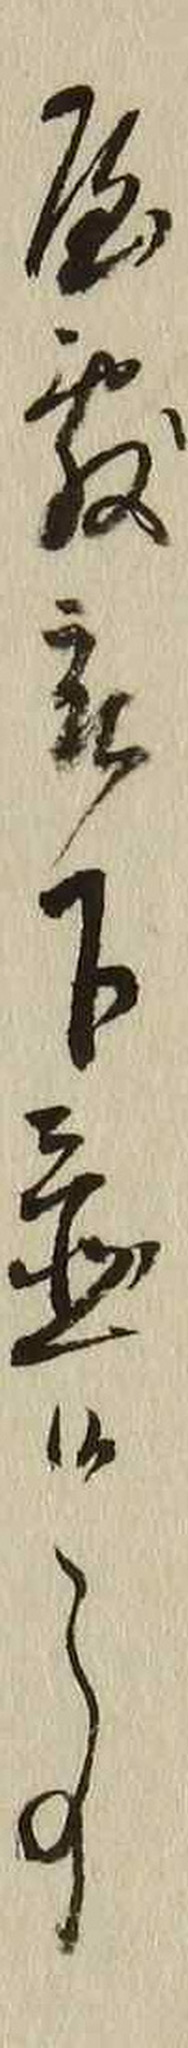屋敷被下置候事
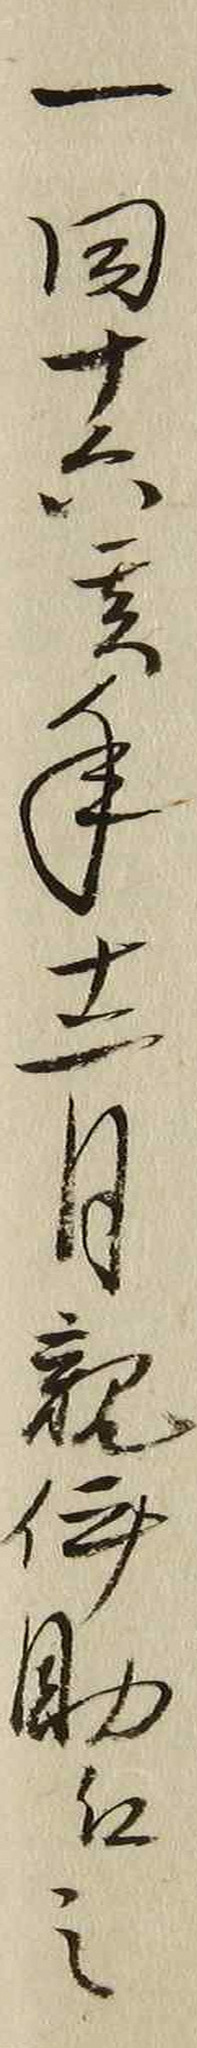一同十六亥年十二月親伊助江之
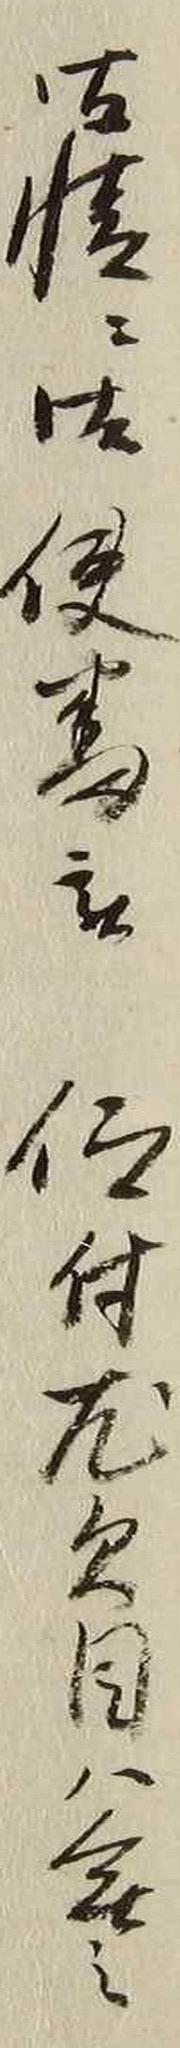御情ニ御使番被仰付尤欠目八年之
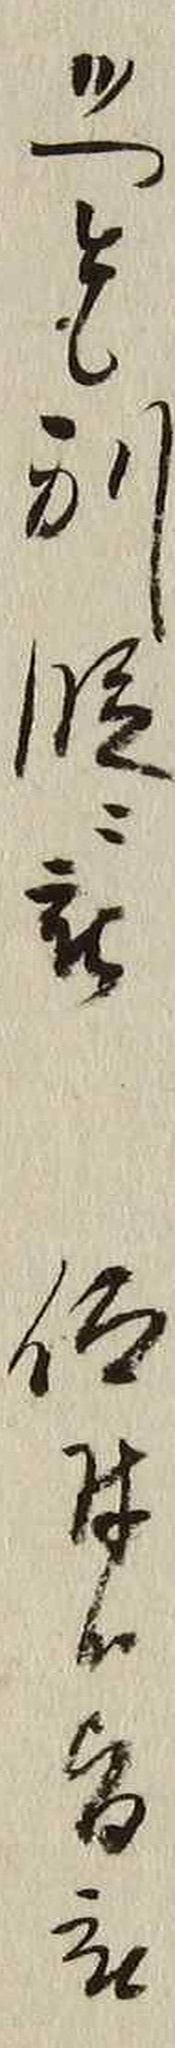候へとも別段ニ被仰付候旨被
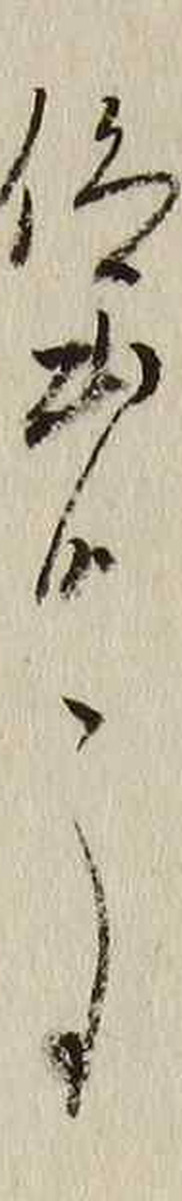仰出候事
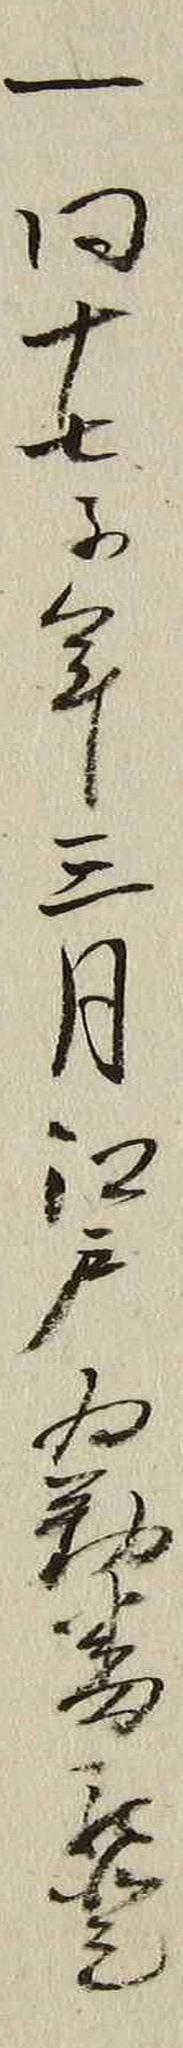一同十七子年三月江戸為勤番罷登
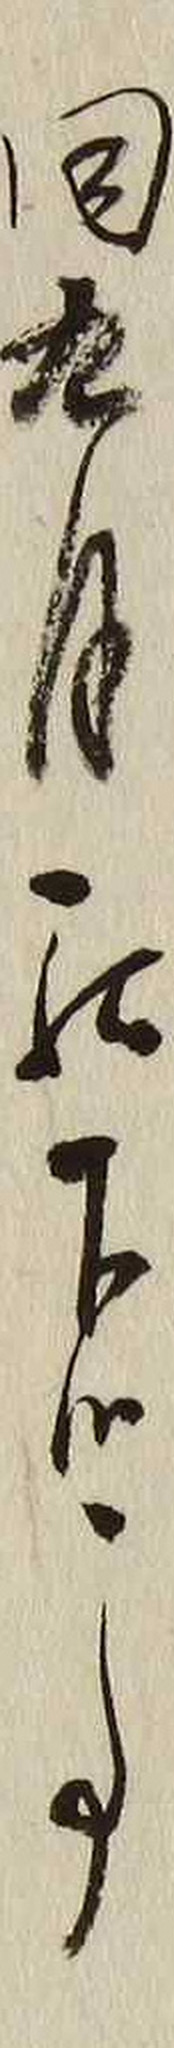同九月罷下候事
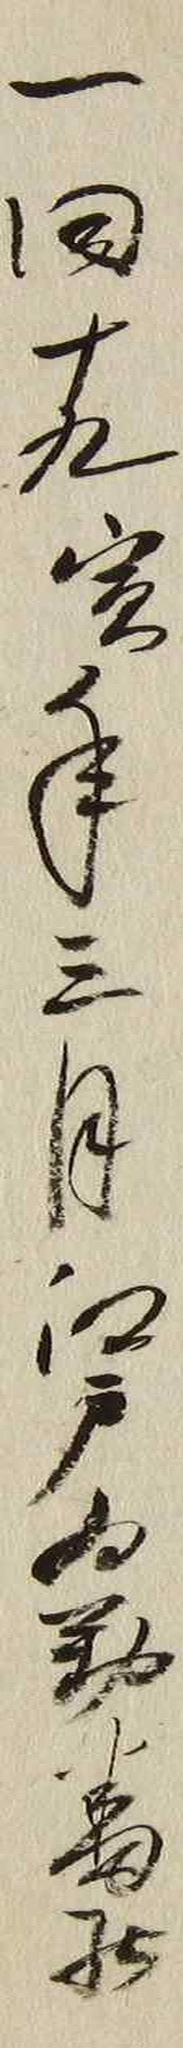一同十九寅年三月江戸為勤番罷
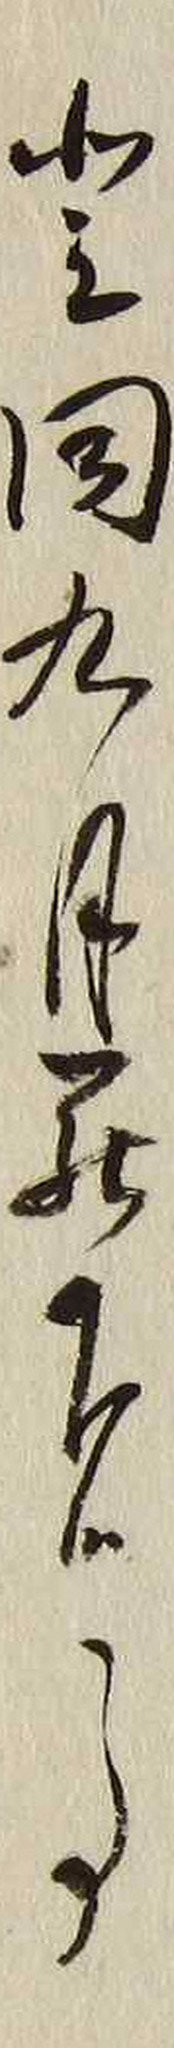登同九月罷下候事
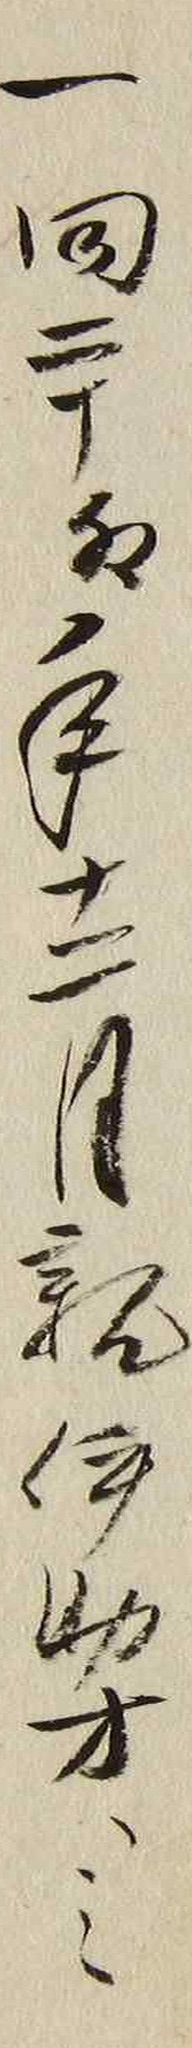一同二十卯年十二月親伊助方へ之
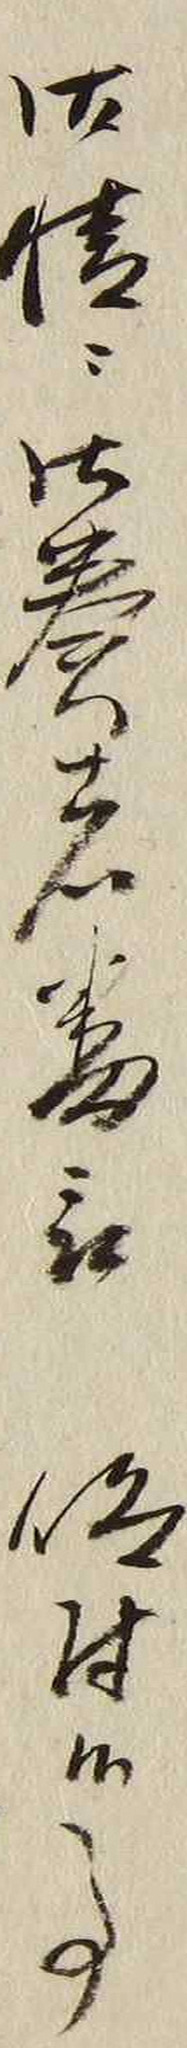御情ニ御奏者番被仰付候事
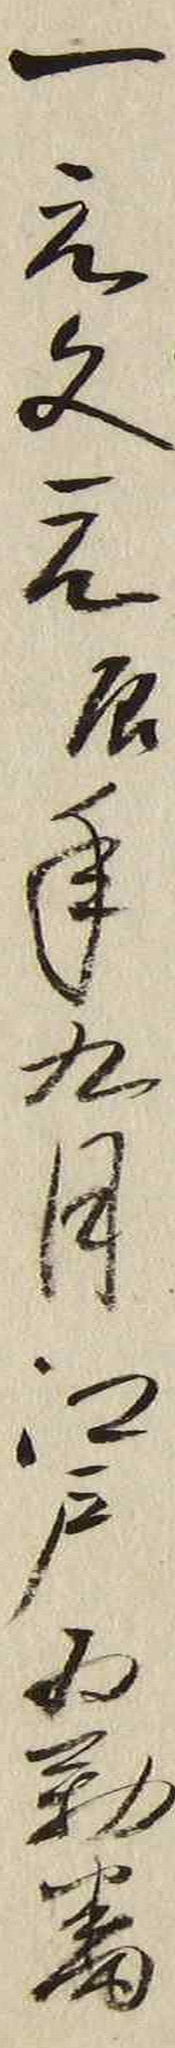一元文元辰年九月江戸為勤番

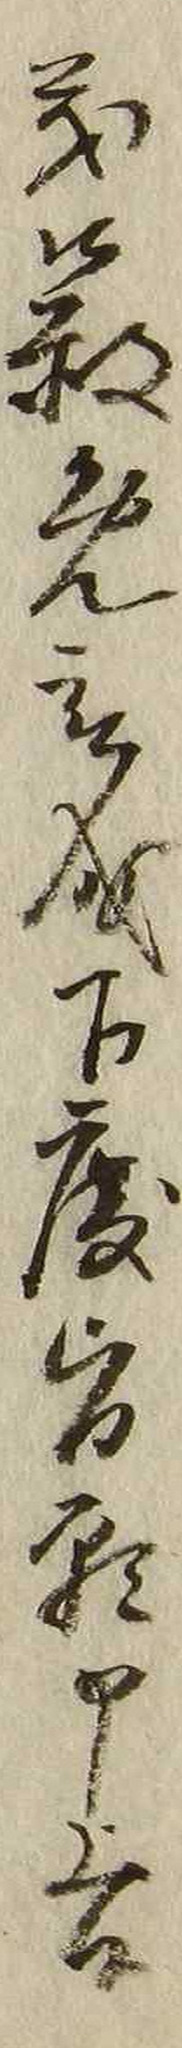義御赦免被成下度旨願申上候
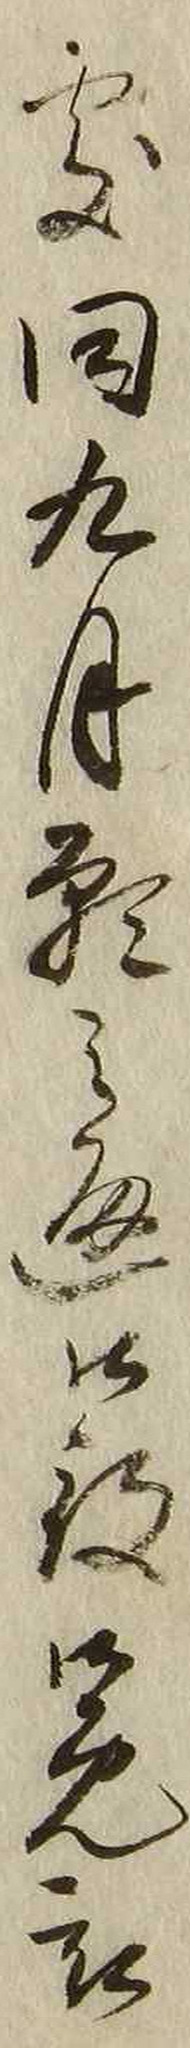処同九月願之通御役御免被
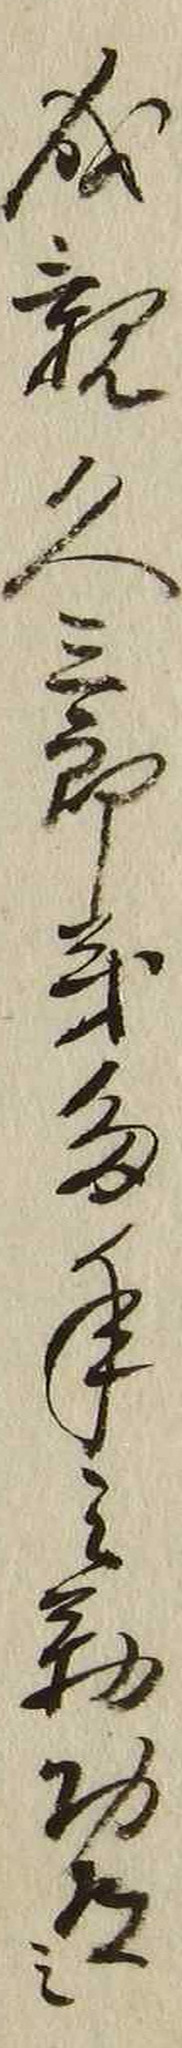成親久三郎義多年之勤功有之
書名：諸士系譜　巻之351　す之部1
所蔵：会津若松市立会津図書館
